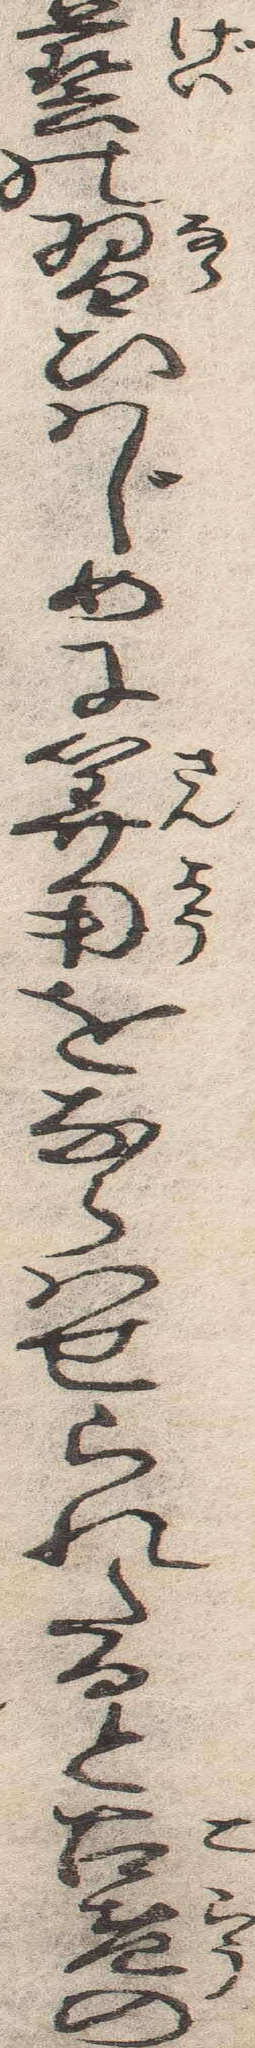芸の習ひはじめに算用をならはせられたると古老の
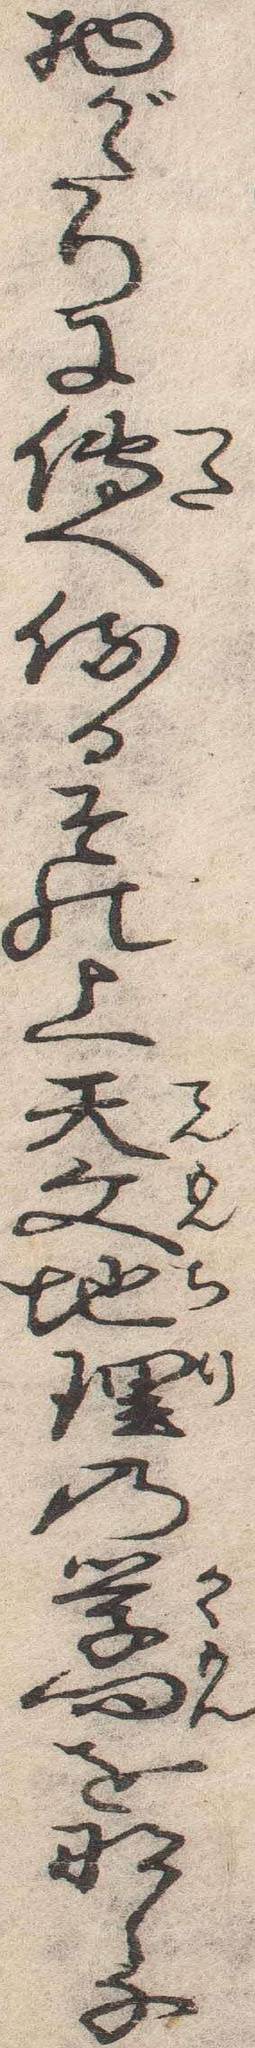物がたりに伝へるるその上天文地理の学問をなし千

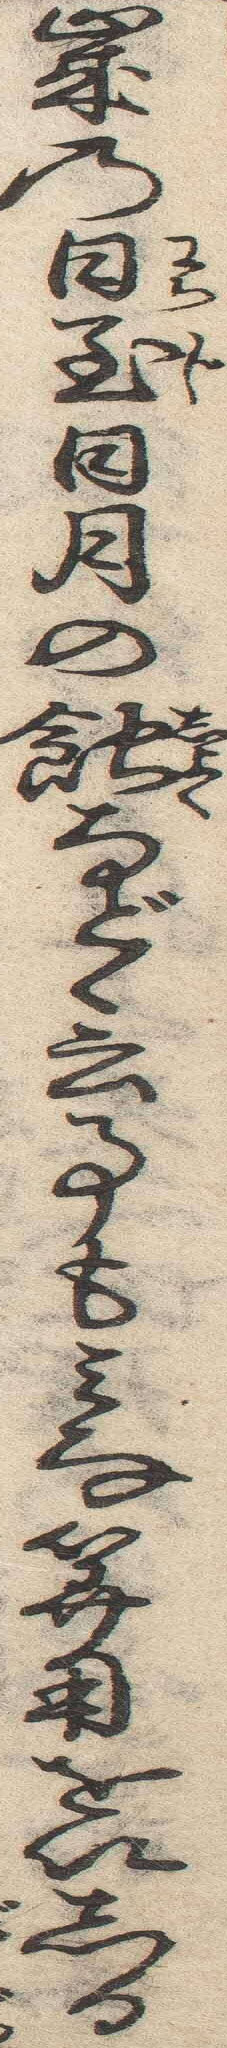歳の日至日月の蝕などゝ云事もみな算用を以しる
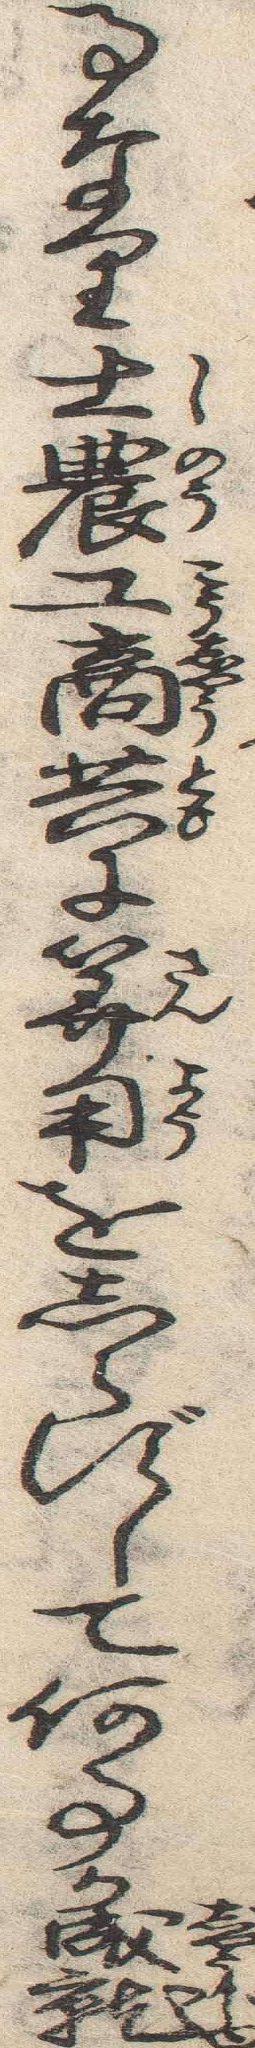事なり士農工商共に算用をしらずして何事か成就
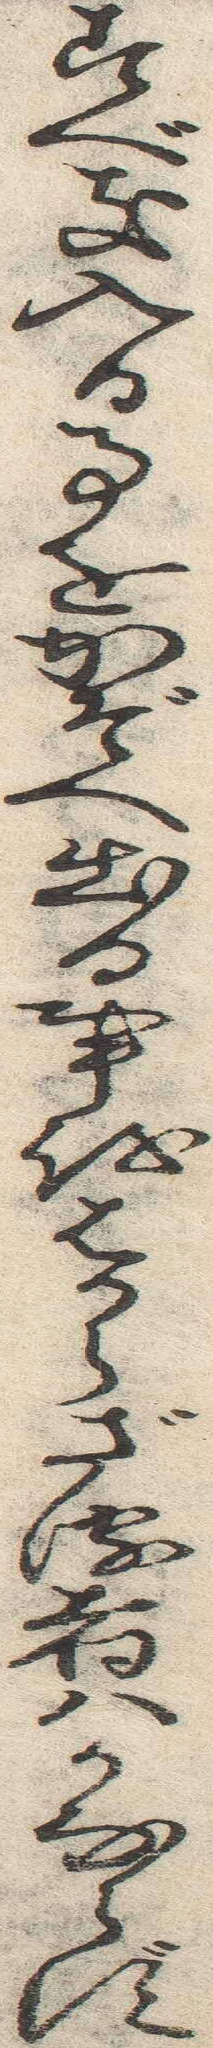すべき入る事をかぞへ出る事をはからざる者はかならず
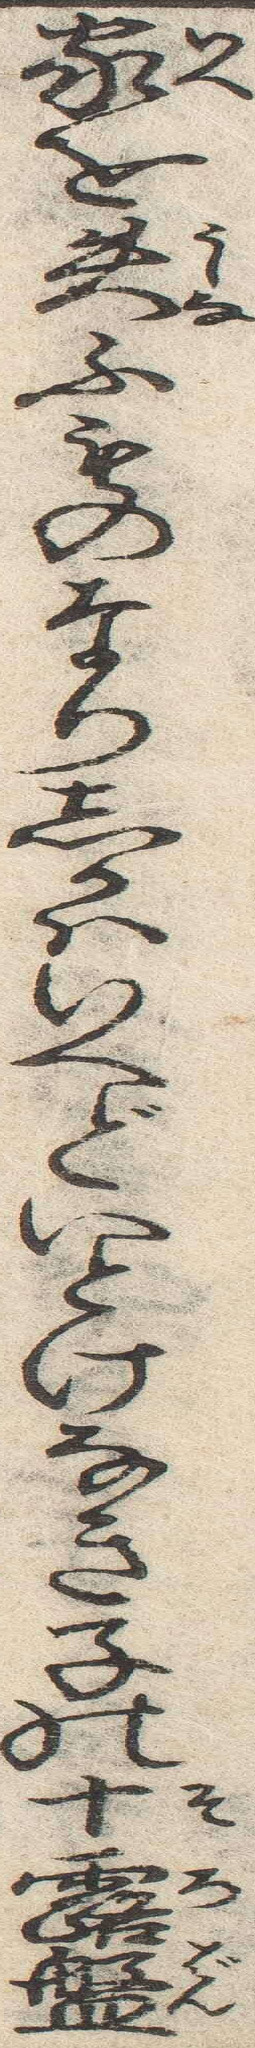家を失ふものなりしかはいへどいとけなき子の十露盤
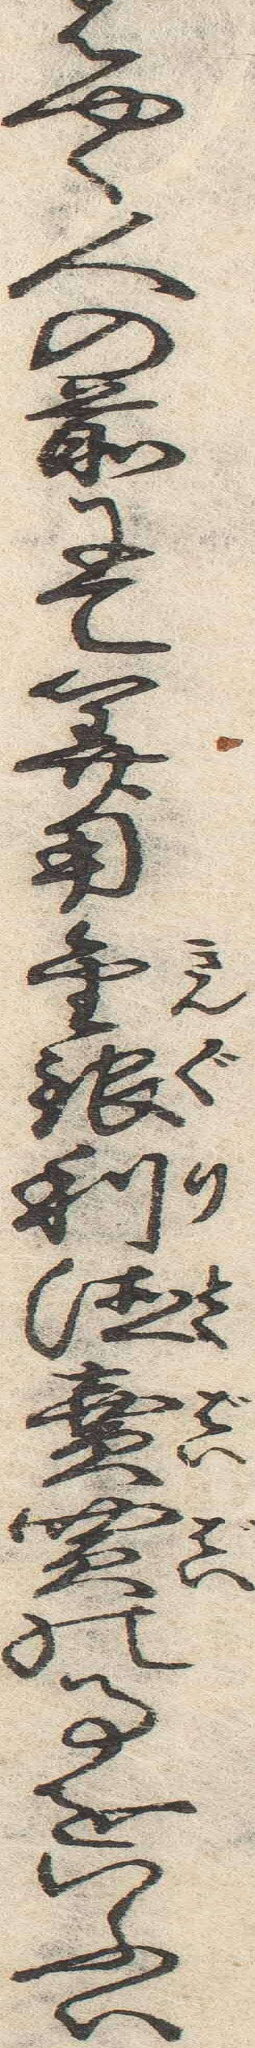はやく人の前にて算用金銀利徳売買の事をいふは
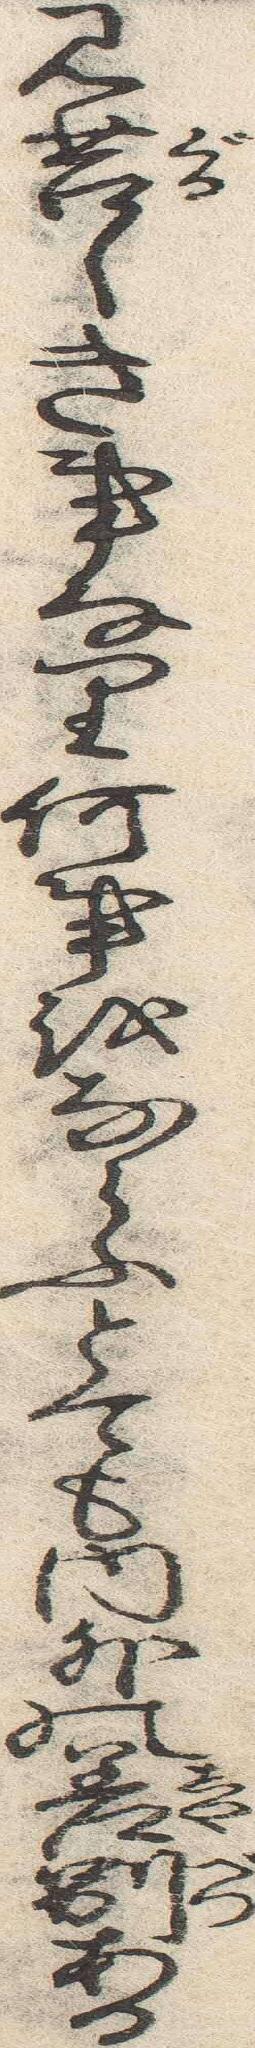見苦しき事なり何事をならふとても内外の差別ある
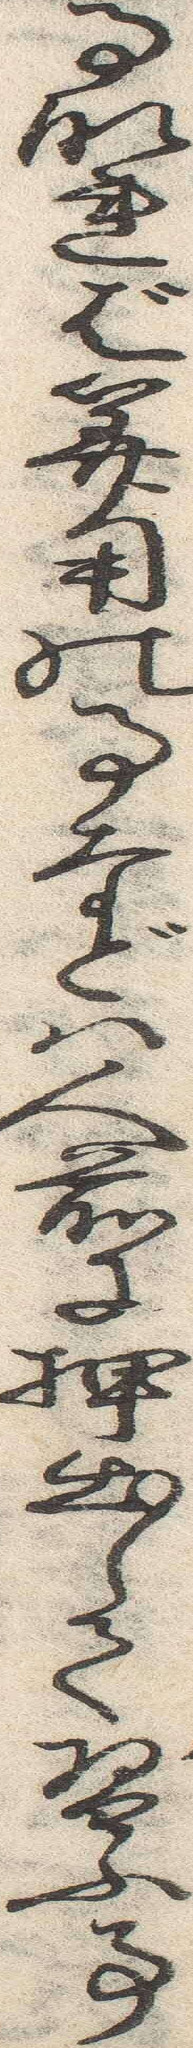事なれば算用の事などは人前に押出して習ふ事
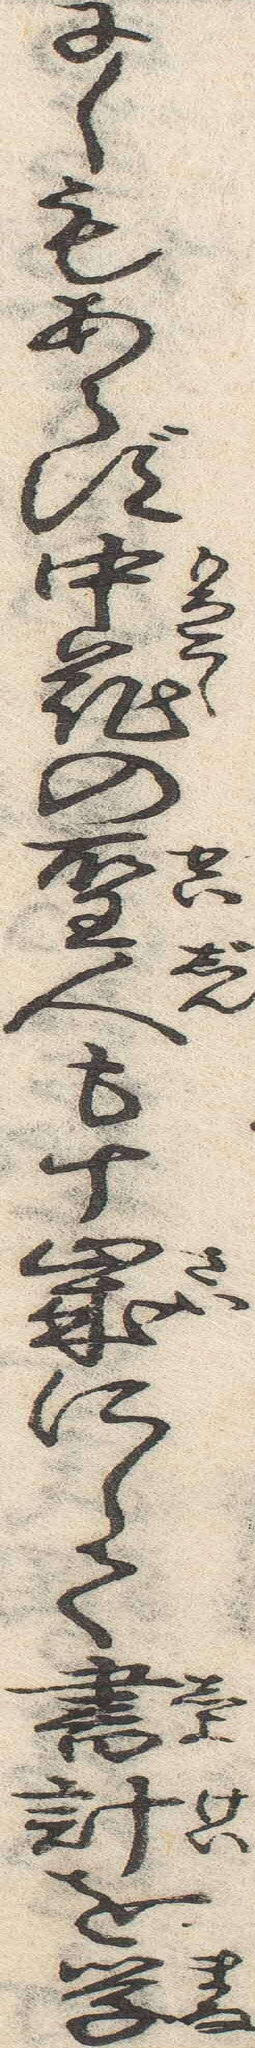にしもあらず中花の聖人も十歳にして書計を学
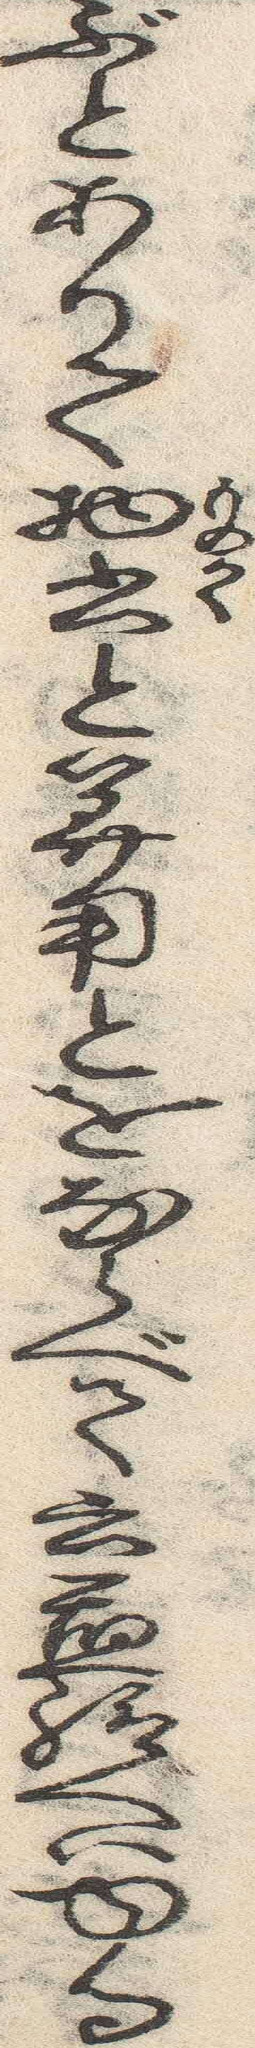ぶとありて物書と算用とをならべて云応給へはゆる
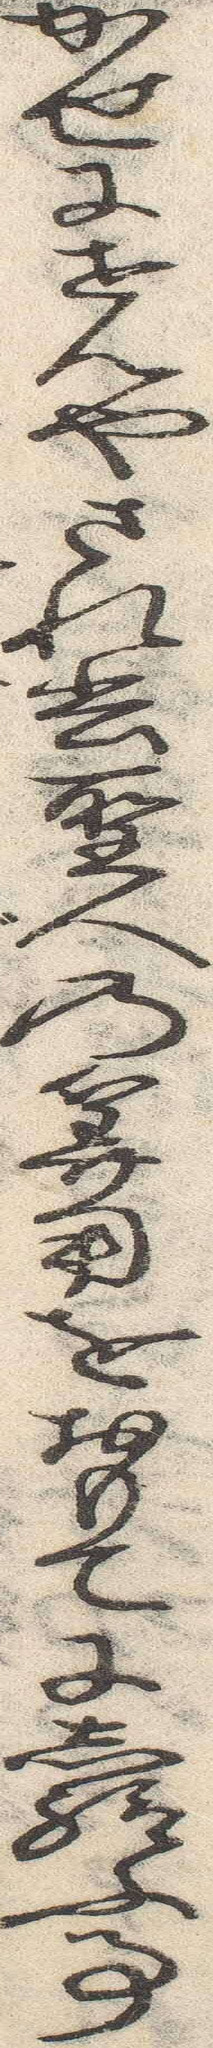かせにせんやされ共聖人の算用をおもてにし給ふ事
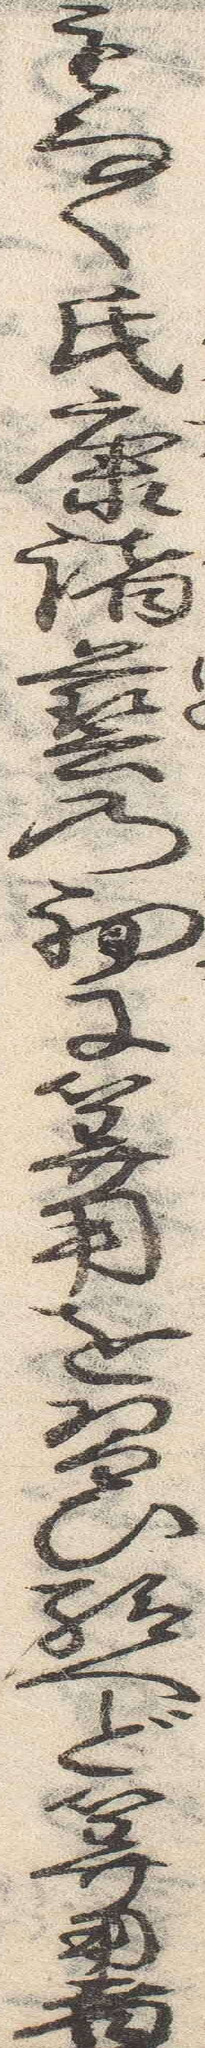もなく氏康諸芸の初に算用を習ひ給へど算用者
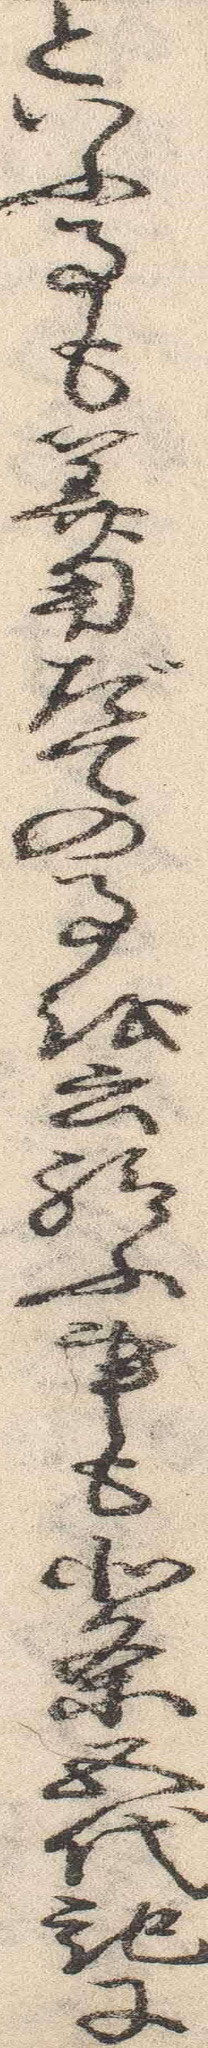といふ事も算用だての事を云給ふ事も北条五代記に
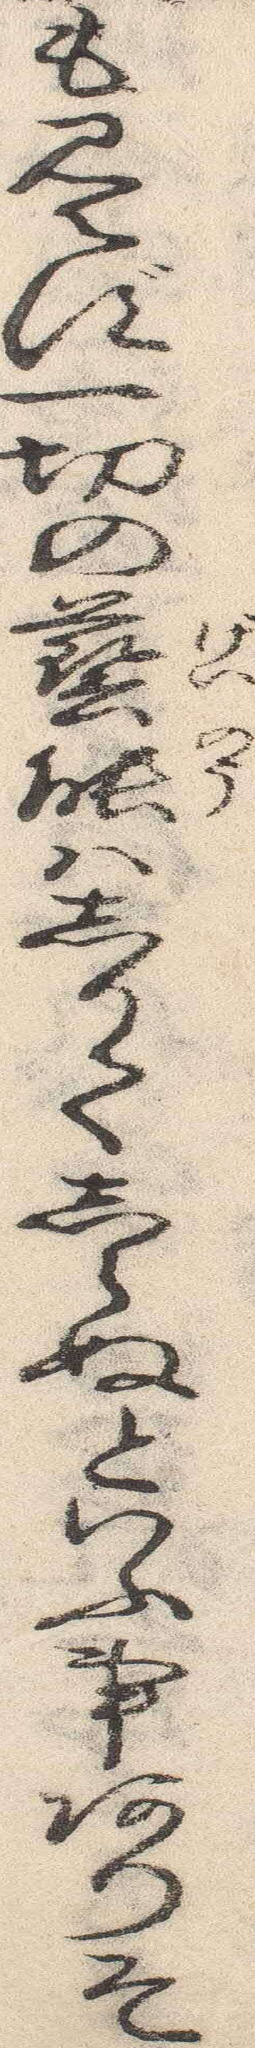も見えず一切の芸能はしりてしらぬといふ事ありそ
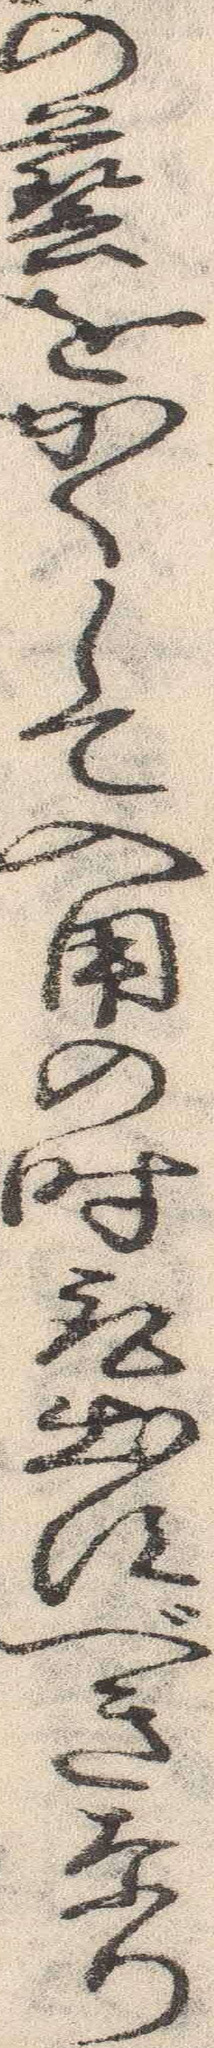の芸をかくして入用の時取出すべきなり
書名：小児必用養育草
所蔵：東京学芸大学附属図書館 国文学研究資料館
